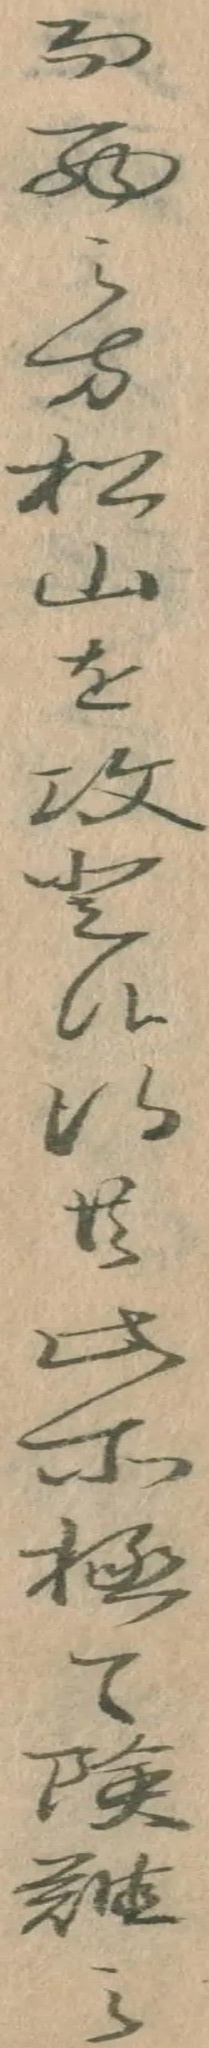而西之方松山を攻登候得共此所極て険難之
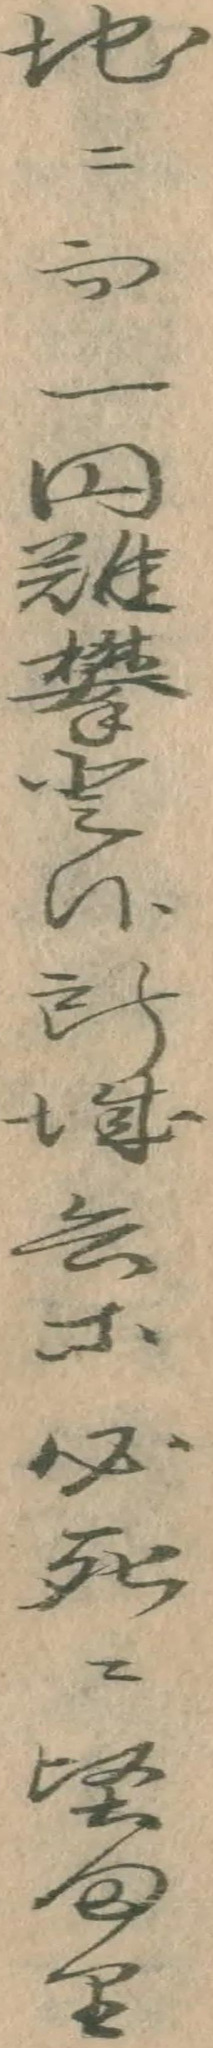地に而一円難攀登候所城兵等必死に堅句里
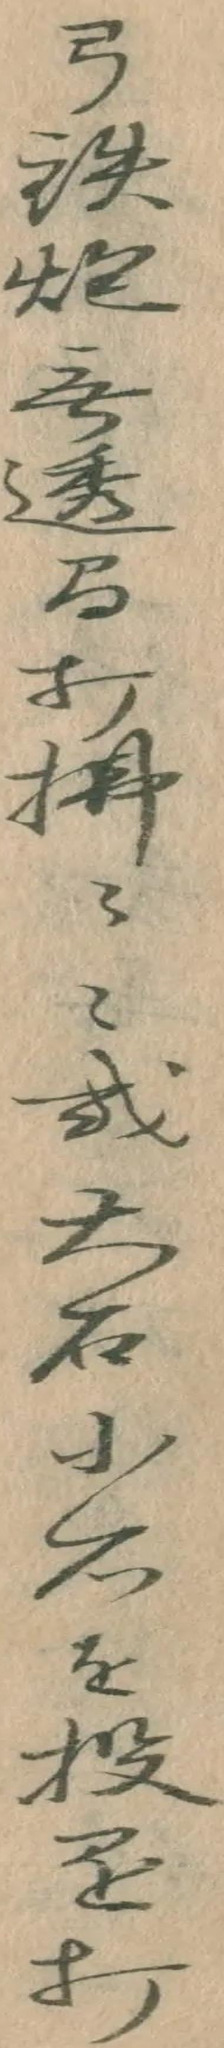弓鉄炮無透間打払々に哉大石小石を投懸打
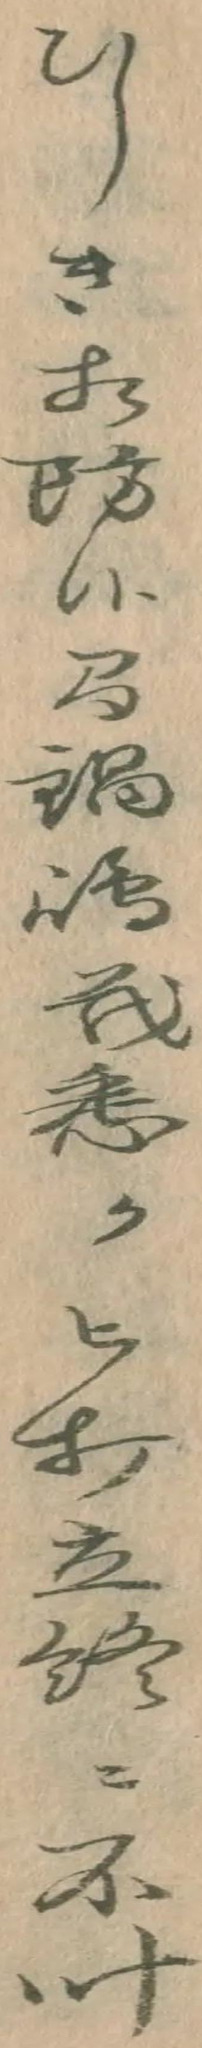ひしき相防候間鍋島茂悉く被打立終に不叶
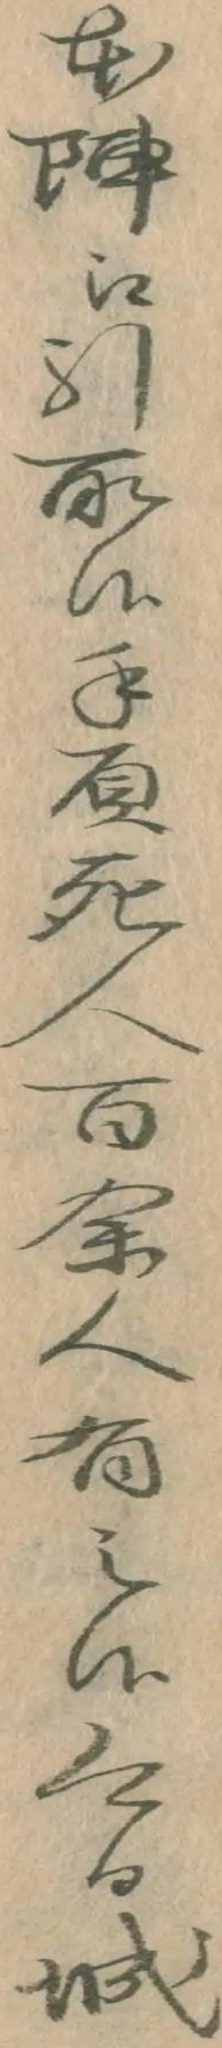本陣江引取候手負死人百余人有之候今日城

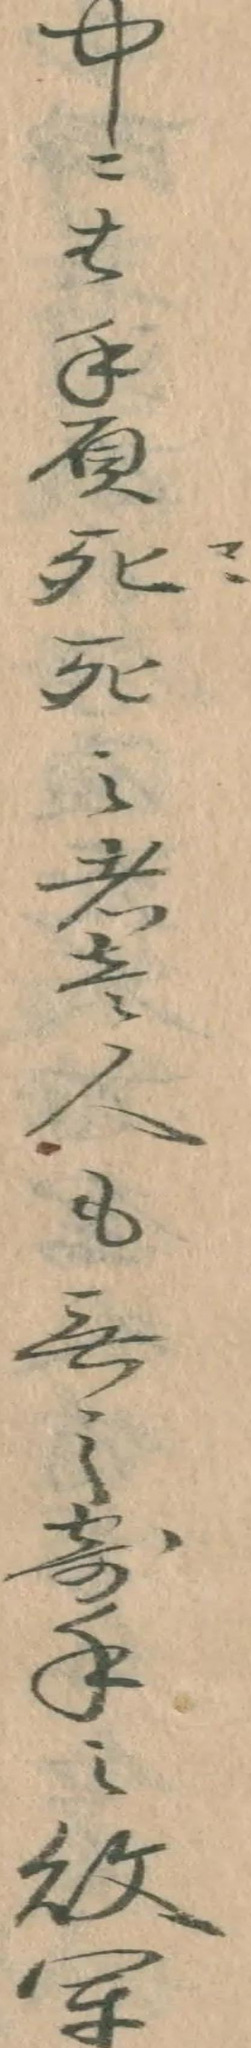中に者手負死死之者壱人も無之寄手之敗軍
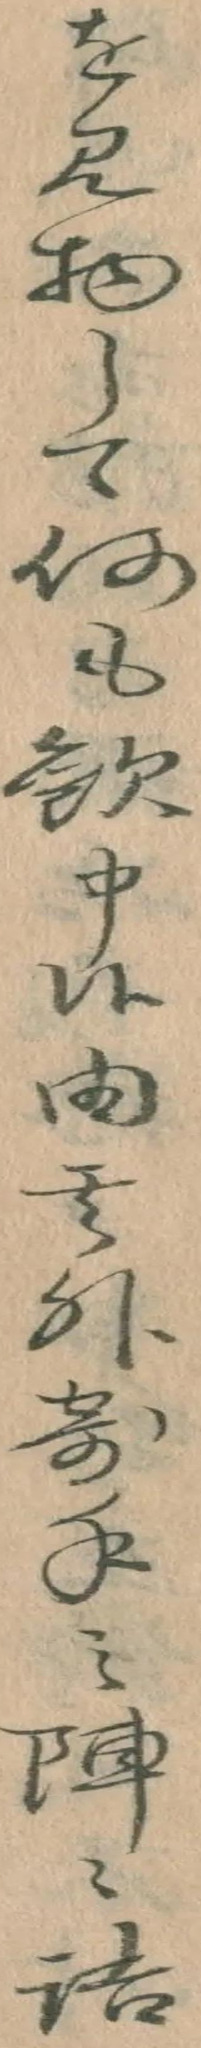を見物して何も歓申候由其外寄手之陣に詰
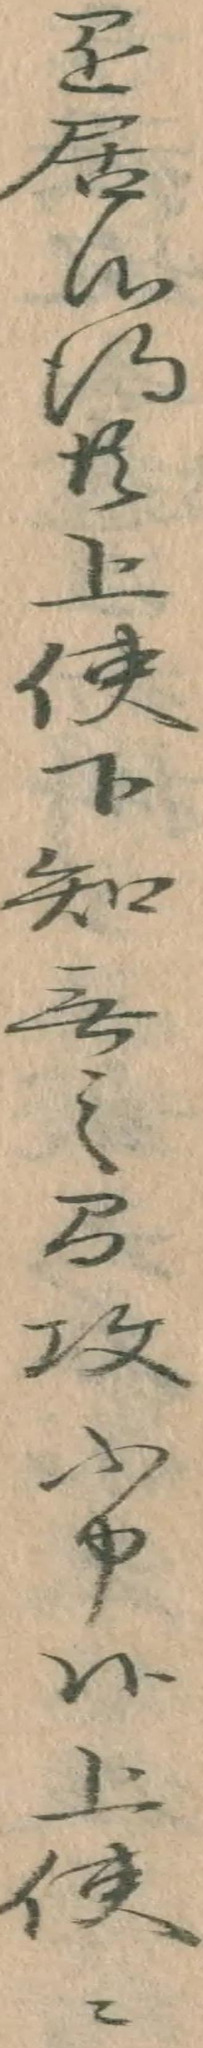懸居候得共上使下知無之間攻ふ申候上使に
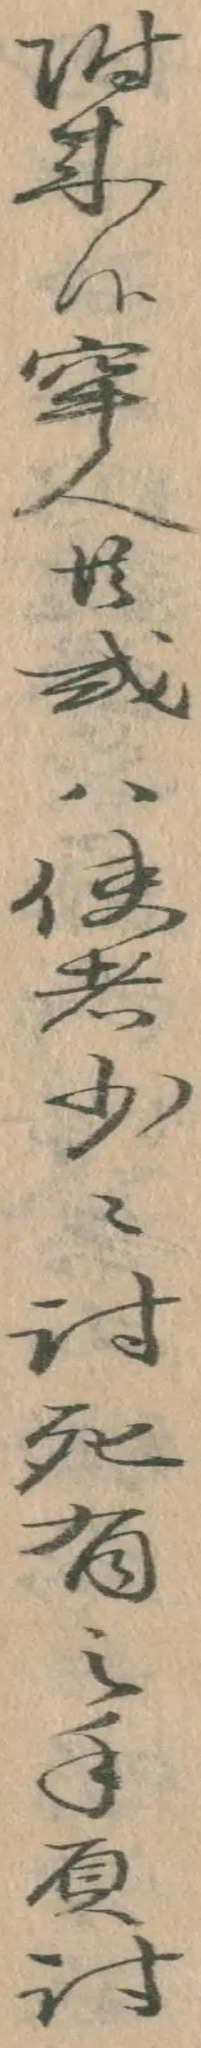附来候牢人共或は使者少々討死有之手負討
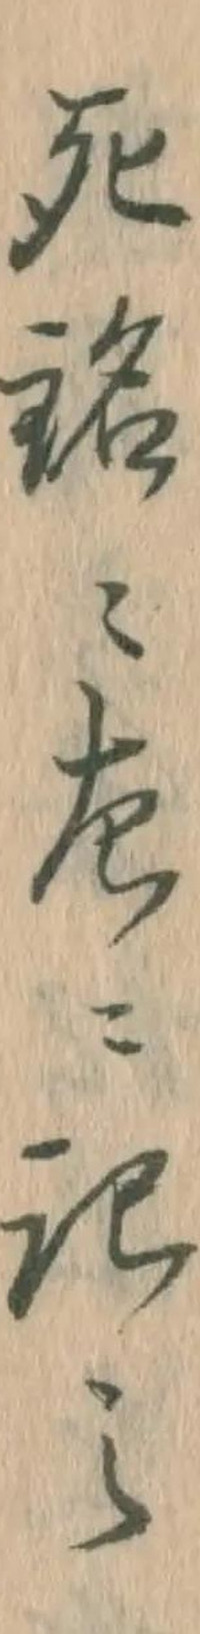死銘々左に記之
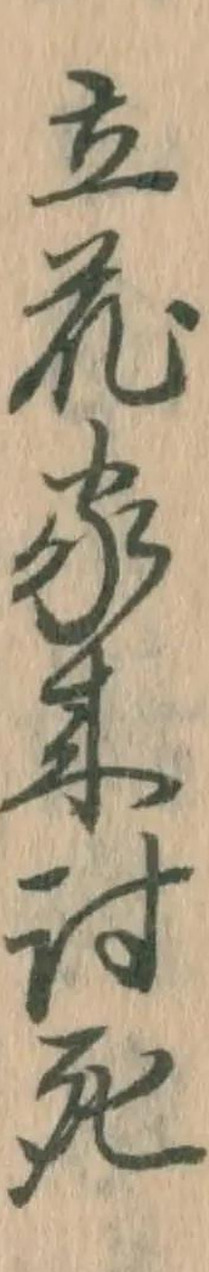立花家来討死
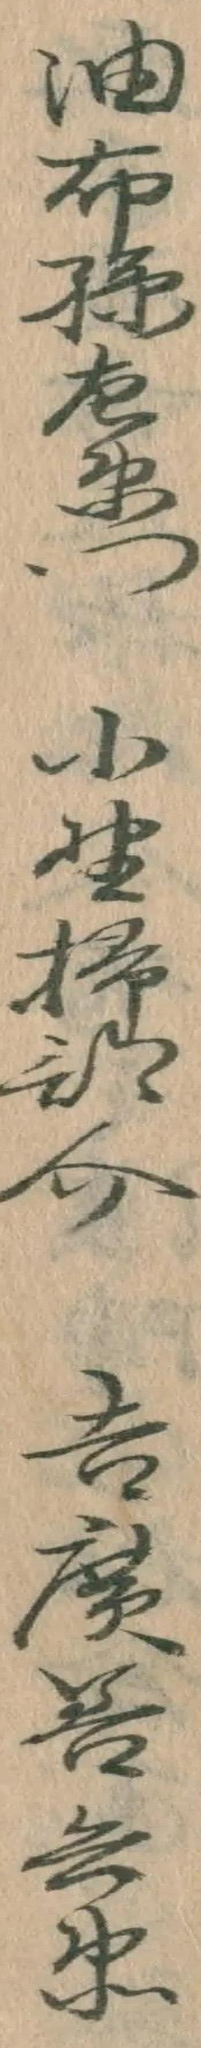油布孫左衛門小野掃部介吉広善兵衛
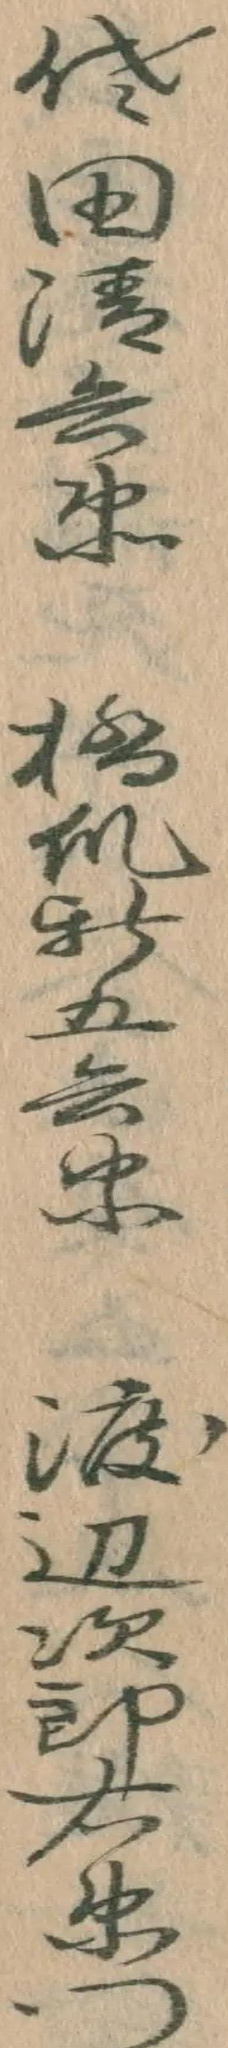佐田清兵衛橋爪新五兵衛渡辺次郎右衛門
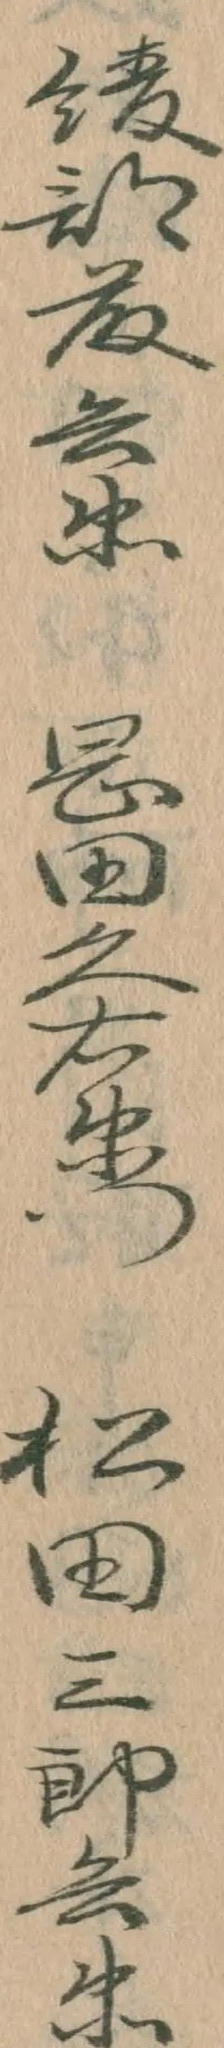綾部藤兵衛岡田久右衛門松田三郎兵衛
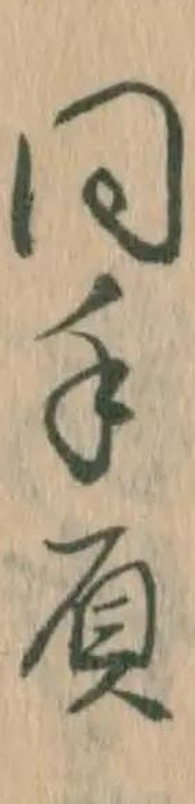同手負
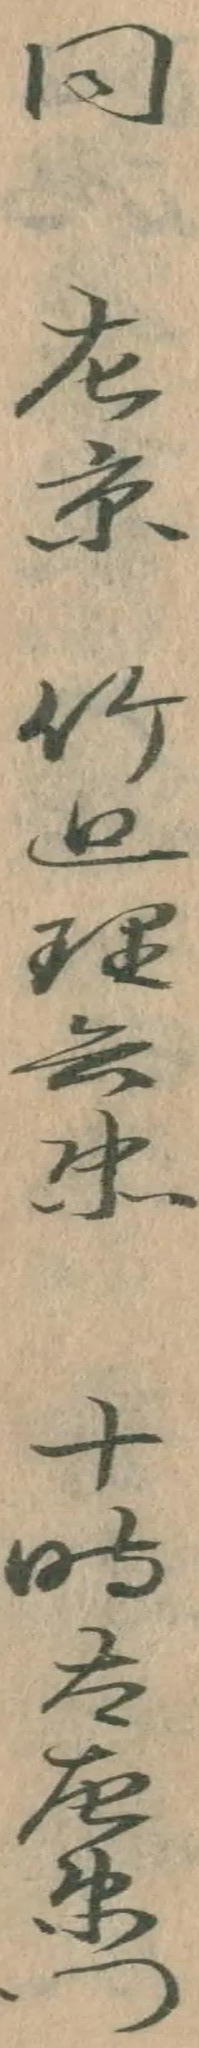同左京竹辺理兵衛十時太左衛門
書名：切支丹御退治記 49巻. [4]
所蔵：国立国会図書館 National Diet Library, JAPAN
